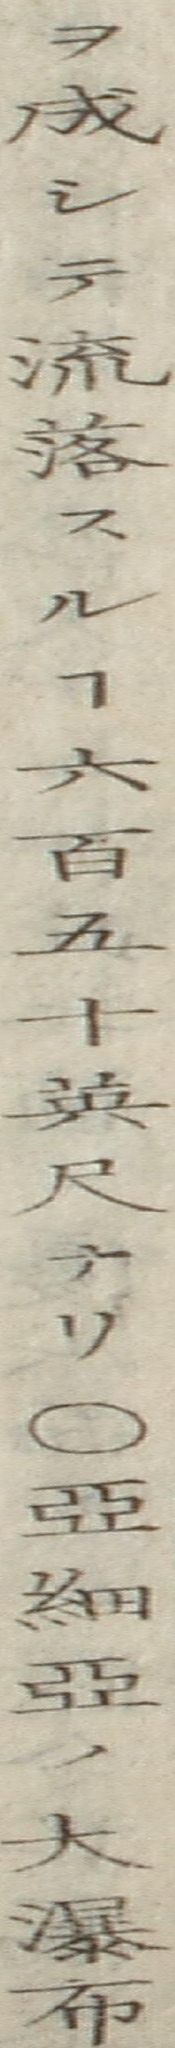ヲ成シテ流落スルヿ大百五十英尺ナリ○亜細亜ノ大瀑布
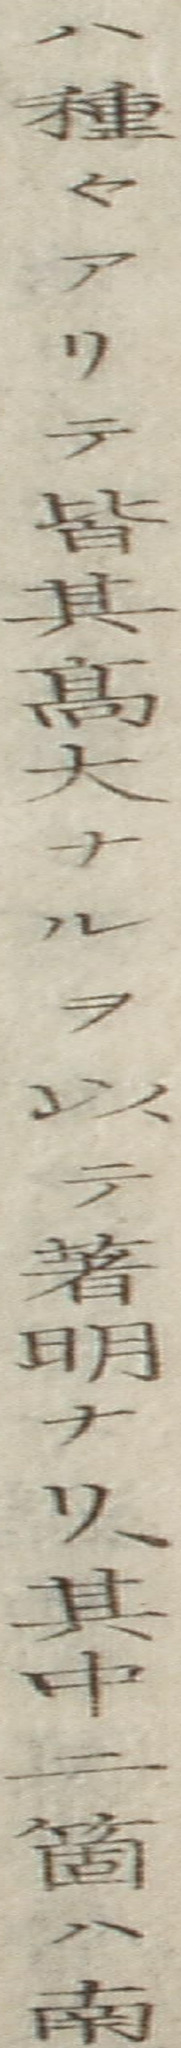ハ種々アリテ皆其高大ナルヲ以テ著明ナリ、其中二箇ハ南
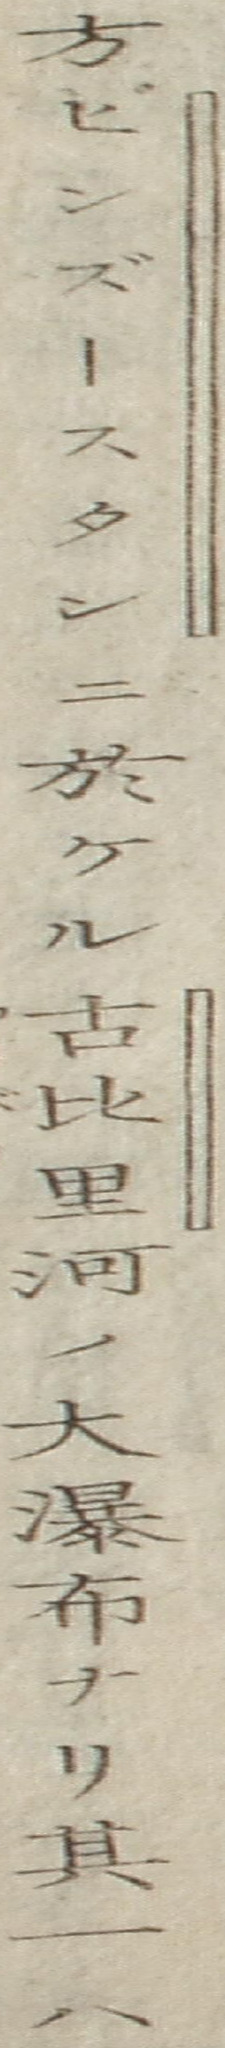方ヒンズースタンニ於ケル古比里河ノ大瀑布ナリ其一ハ
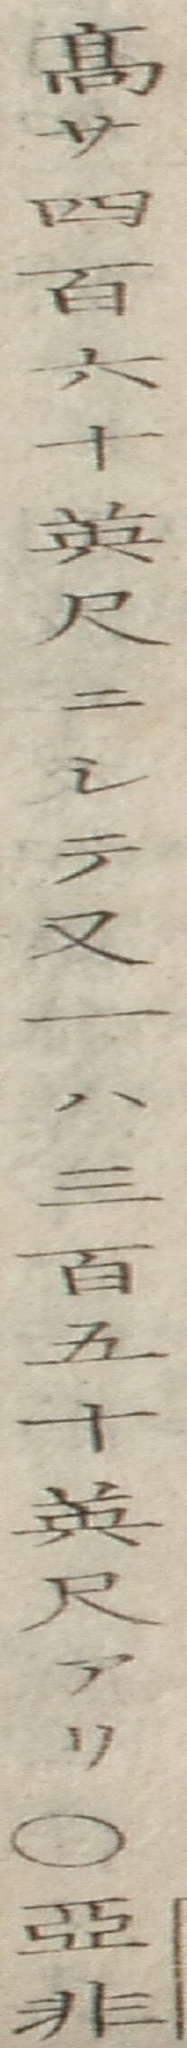高サ四百六十英尺ニシテ又一ハ三百五十英尺アリ○亜非

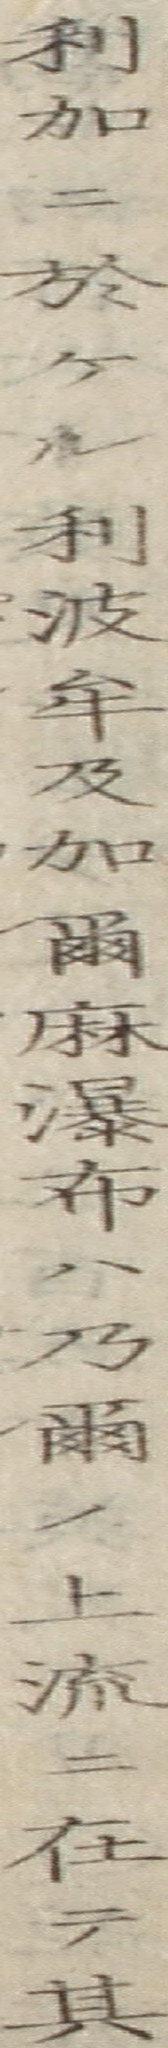利加ニ於ケル利波牟及加爾麻瀑布ハ乃爾ノ上流ニ在テ其
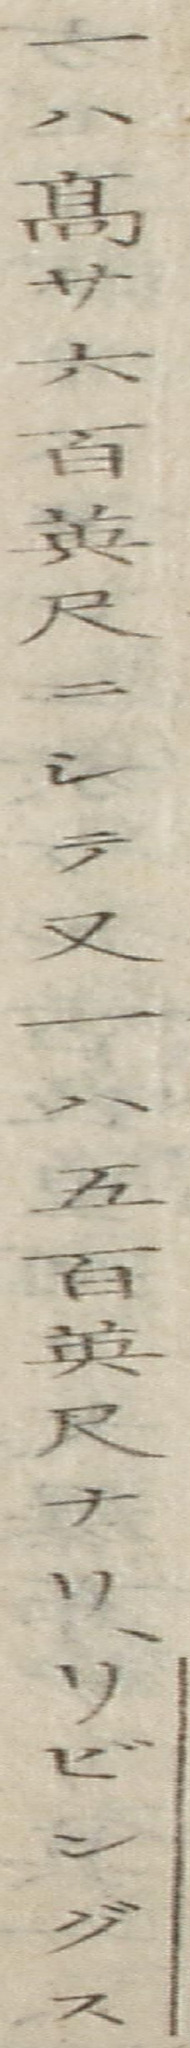一ハ高サ六百英尺ニシテ又一ハ五百英尺ナリ、リビングス
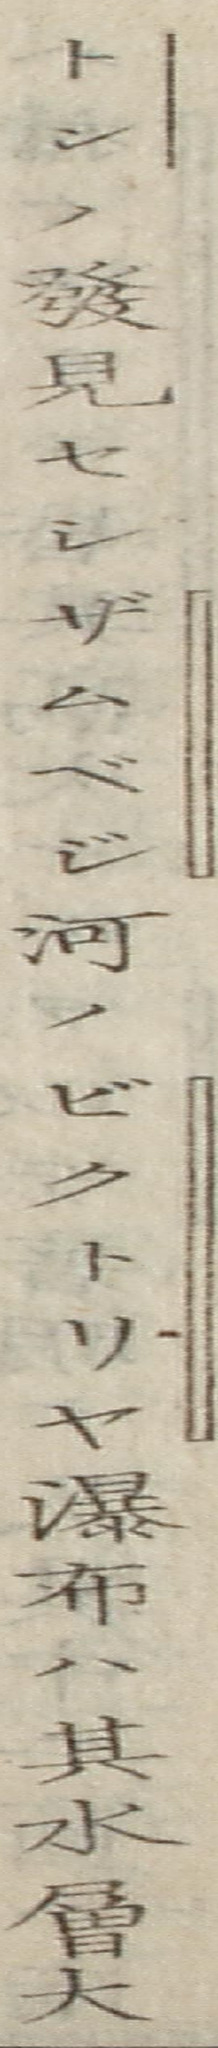トンノ発見セシザムベジ河ノビクトリヤ瀑布ハ其水層大
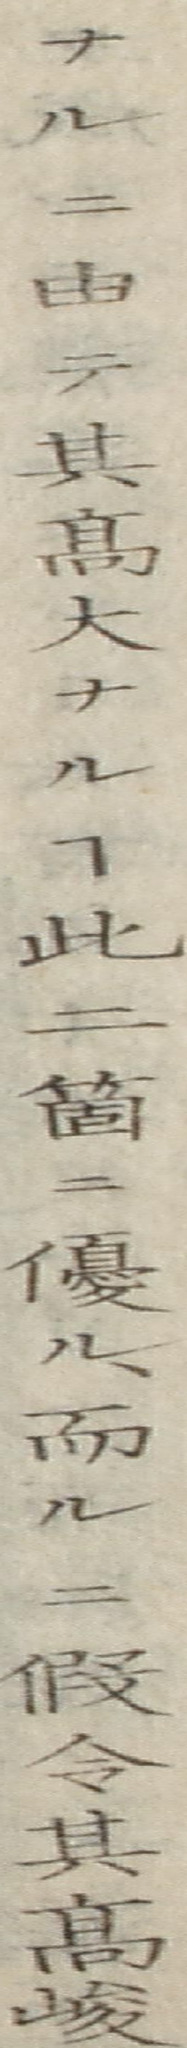ナルニ由テ其高大ナルヿ此二箇ニ優ル、而ルニ仮令其高峻
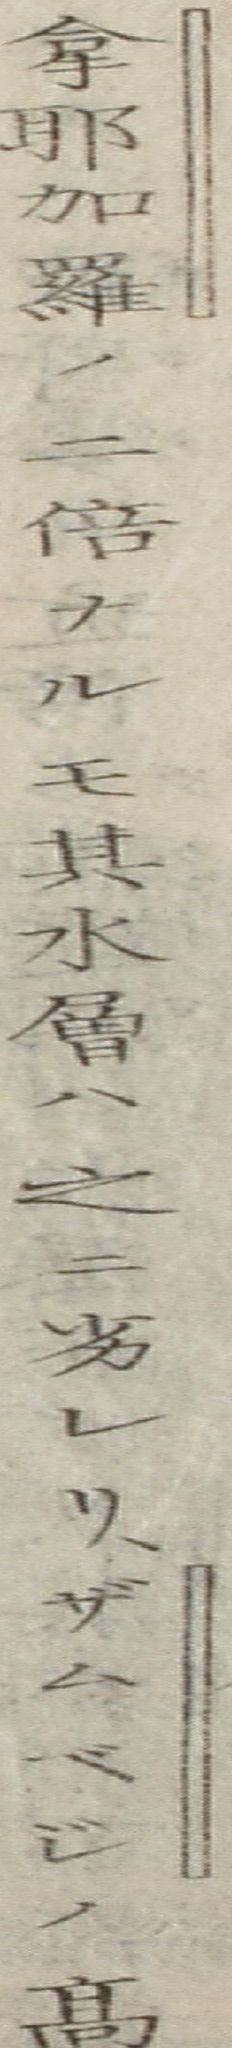拿那加羅ノ二倍ナルモ其水層ハ之ニ劣レリ、ザムベジノ高
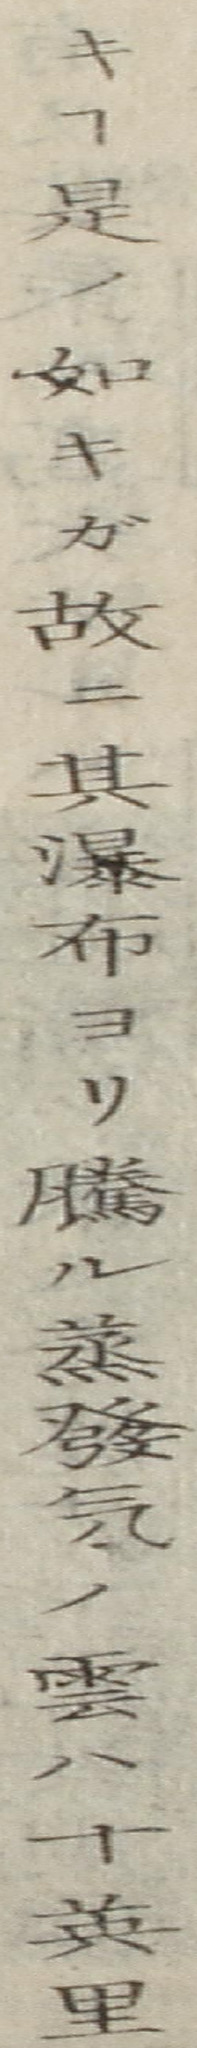キヿ是ノ如キガ故ニ其瀑布ヨリ騰ル蒸発気ノ雲ハ十英里
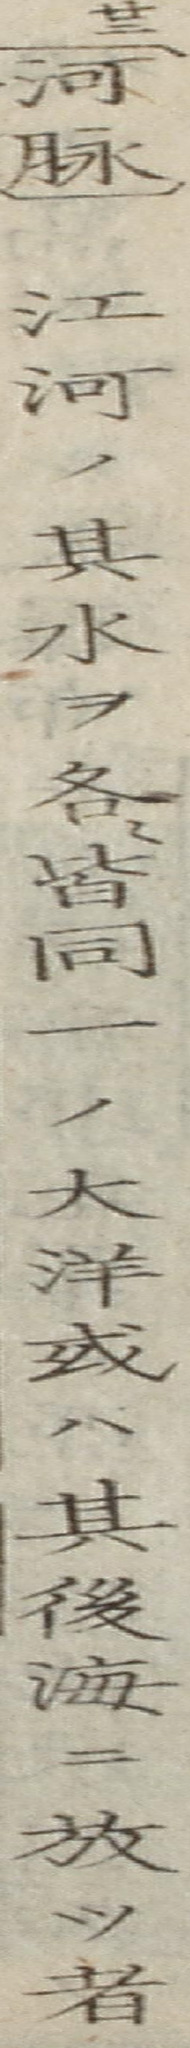廿二〔河脉〕江河ノ其水ヲ各々皆同一ノ大洋或ハ其後悔ニ放ツ者
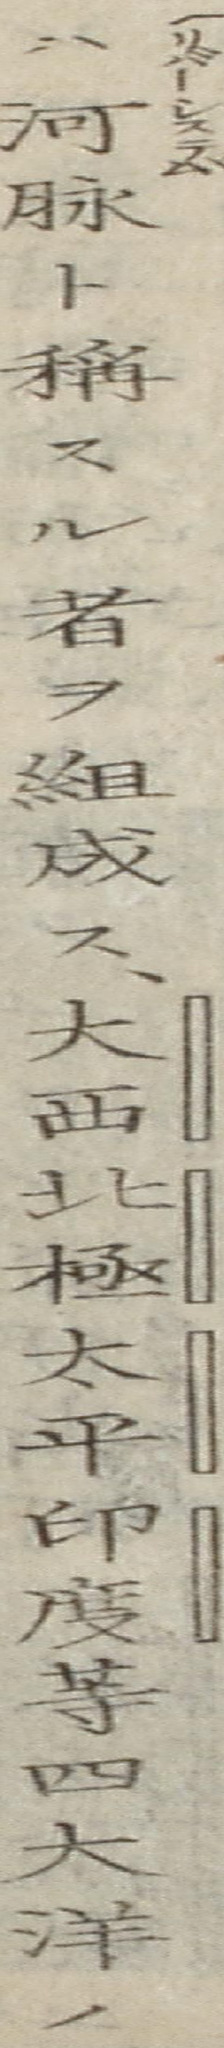ハ河脈ト称スル者ヲ組成ス、大西北極太平印度等四大洋ノ
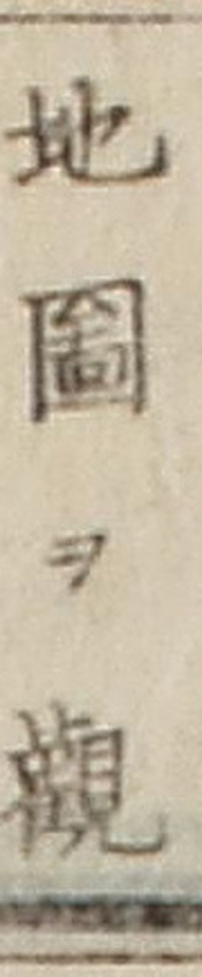地図ヲ観
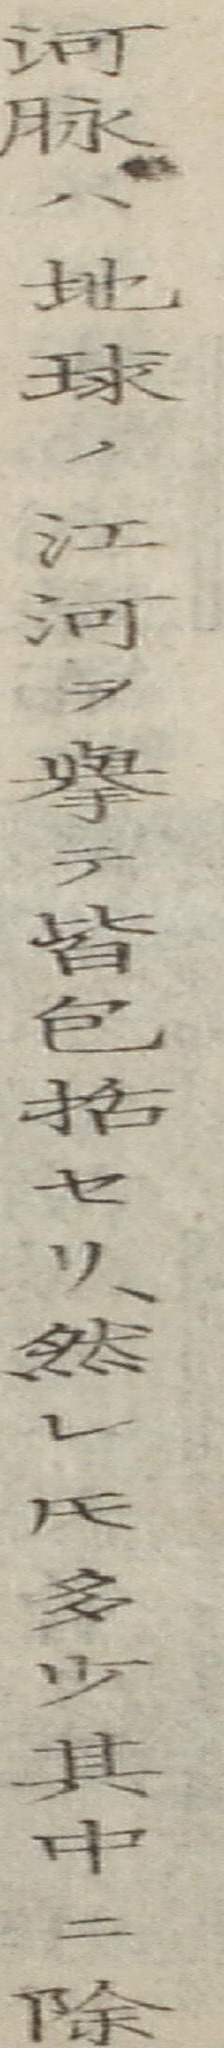河脈●ハ地球ノ江河ヲ挙テ皆包括セリ、然レトモ多少其中ニ除
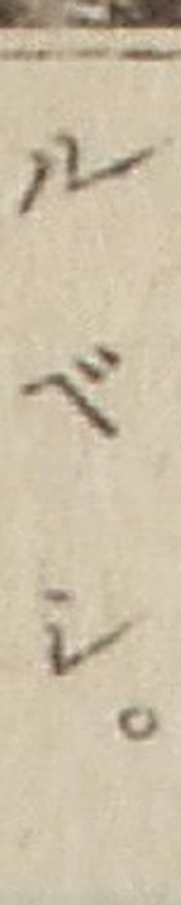ルベシ。
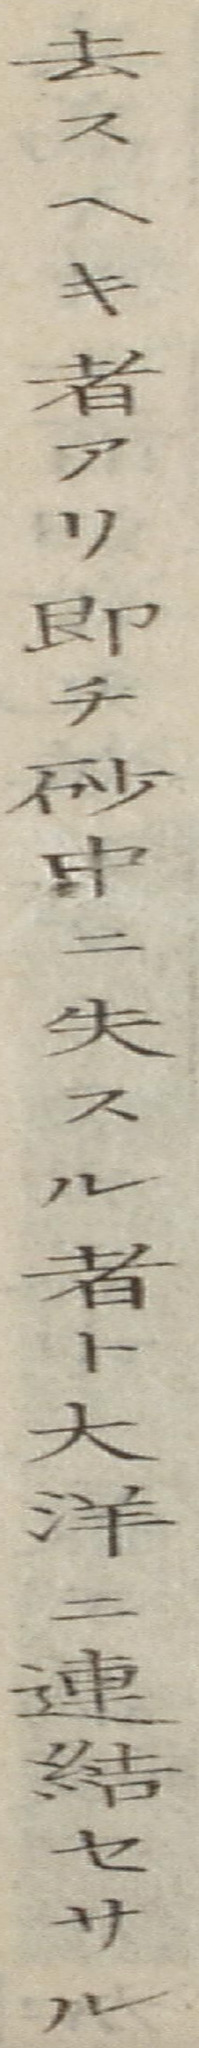去スヘキ者アリ即チ砂中ニ失スル者ト大洋ニ連絡セサル
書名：地形論　巻二
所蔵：東京大学地震研究所図書室 Earthquake Research Institute Library, The University of Tokyo, JAPAN
